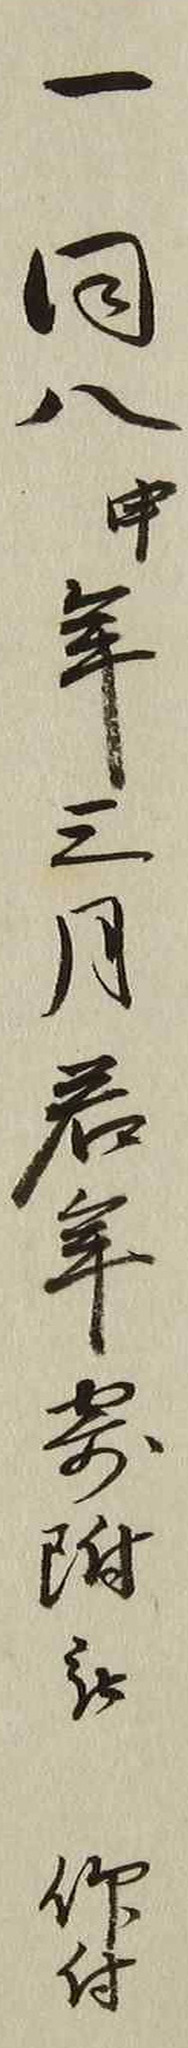一同八申年三月若年寄附被仰付
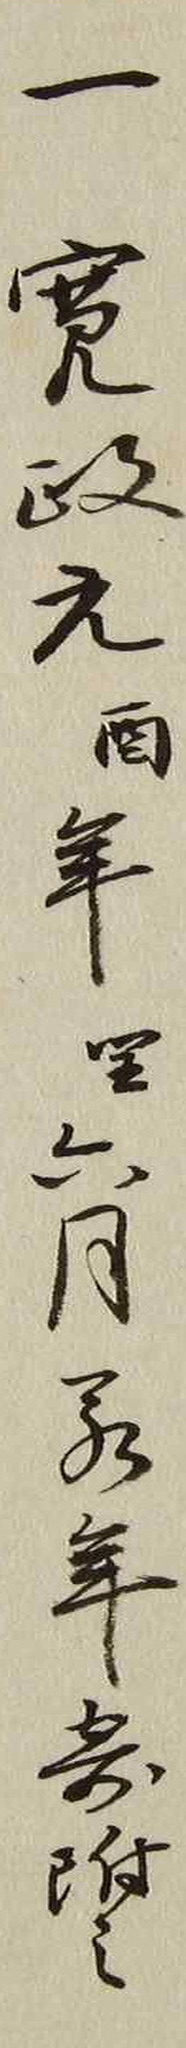一寛政元酉年閏六月若年寄附之
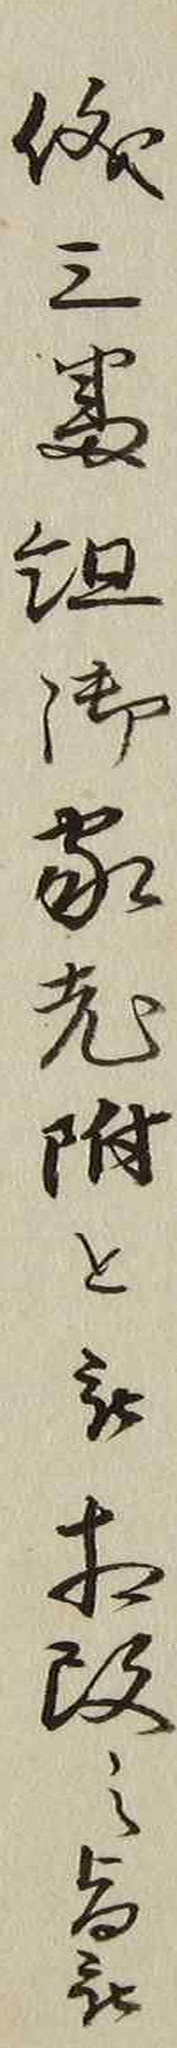儀三番組御家老附と被相改之旨被
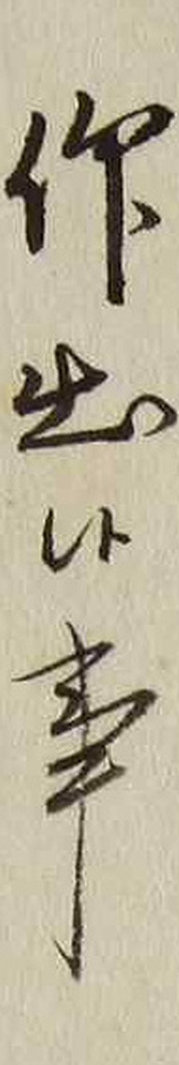仰出候事
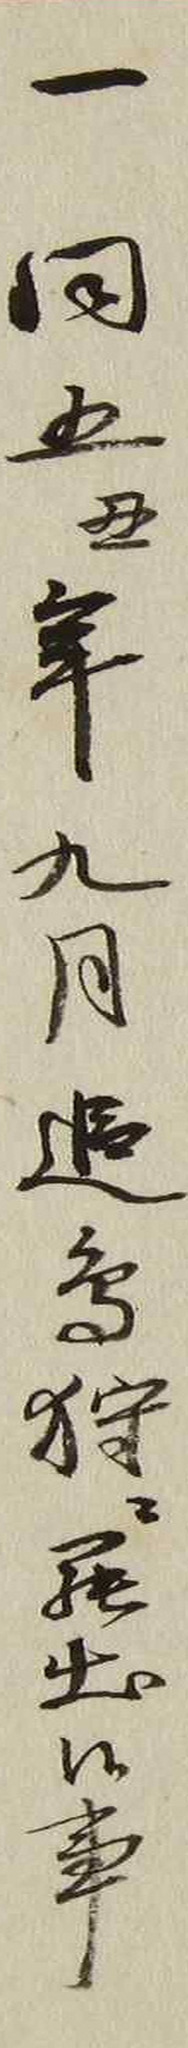一同五丑年九月追鳥狩ニ罷出候事
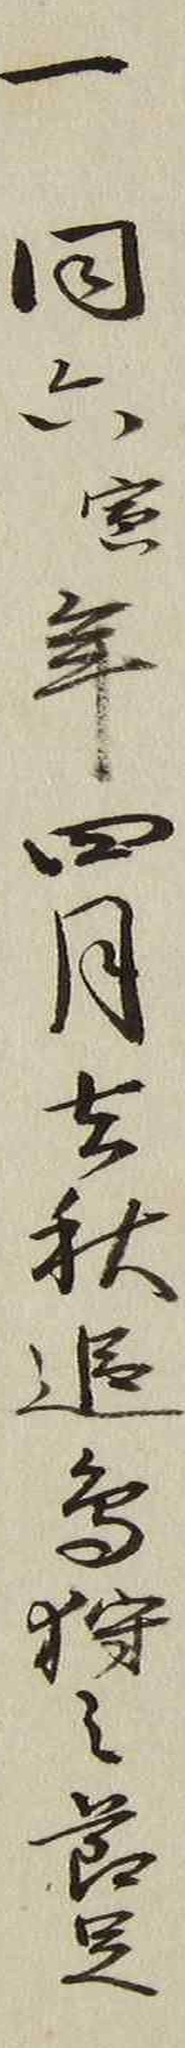一同六寅年四月去秋追鳥狩之節足
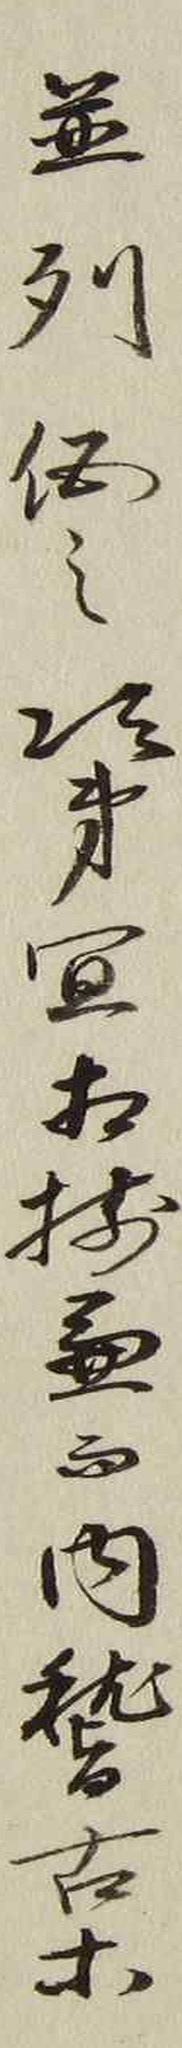並列伍之次第宜相揃兼而内稽古等
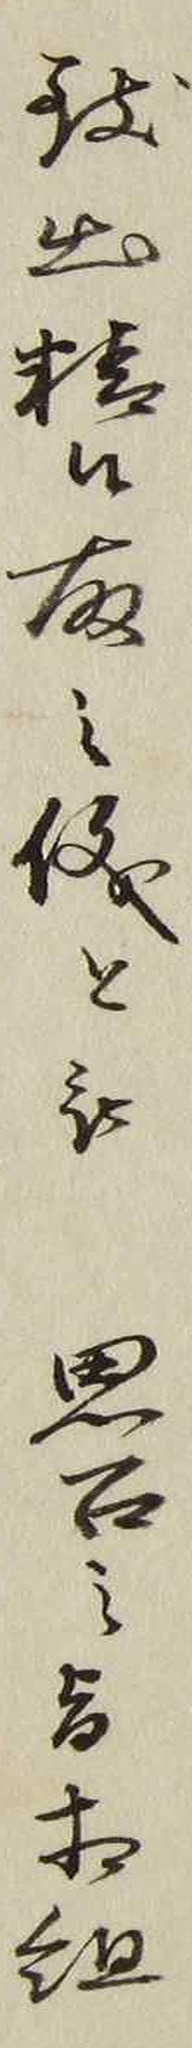致出精候故之儀と被思召之旨相組
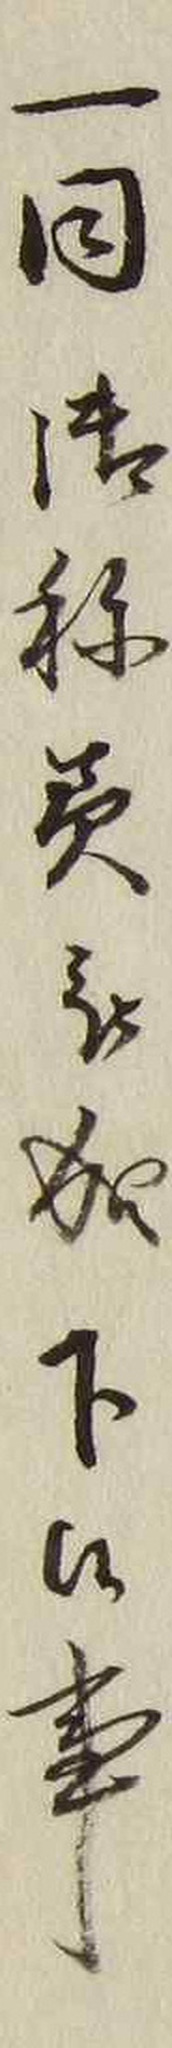一同御称美被成下候事

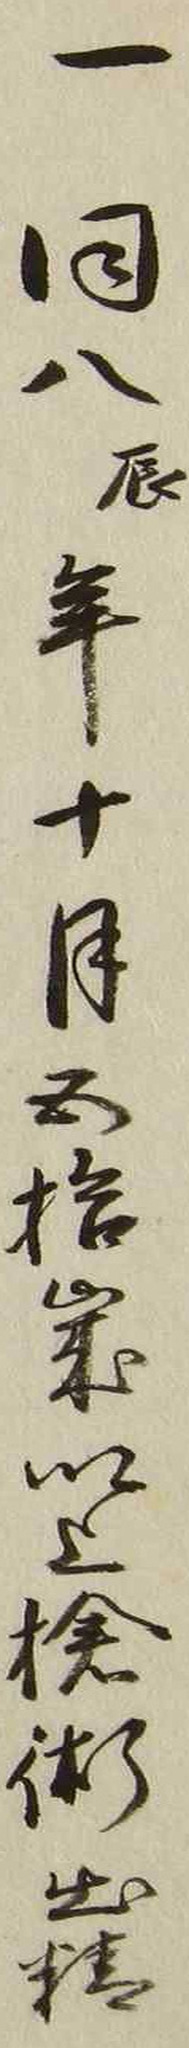一同八辰年十月五拾歳以上槍術出精
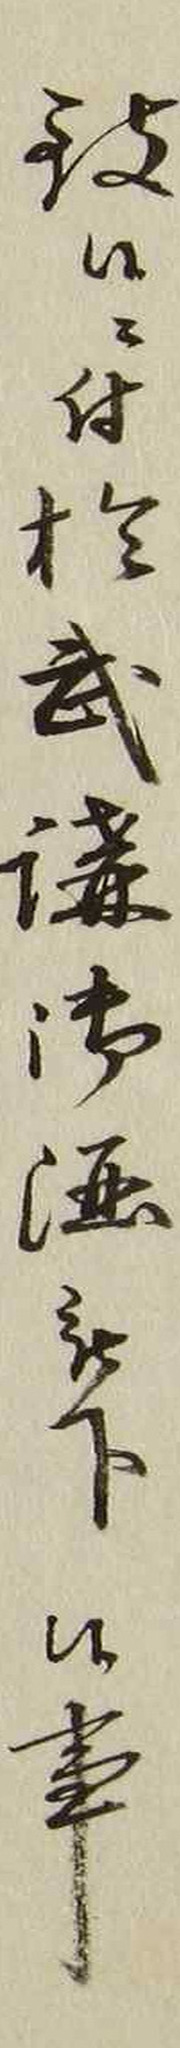致候ニ付於武講御酒被下候事
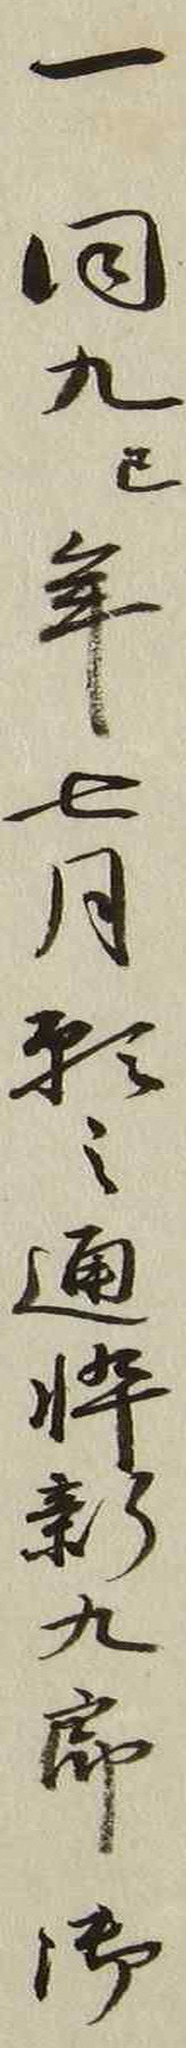一同九巳年七月願之通忰新九郎御
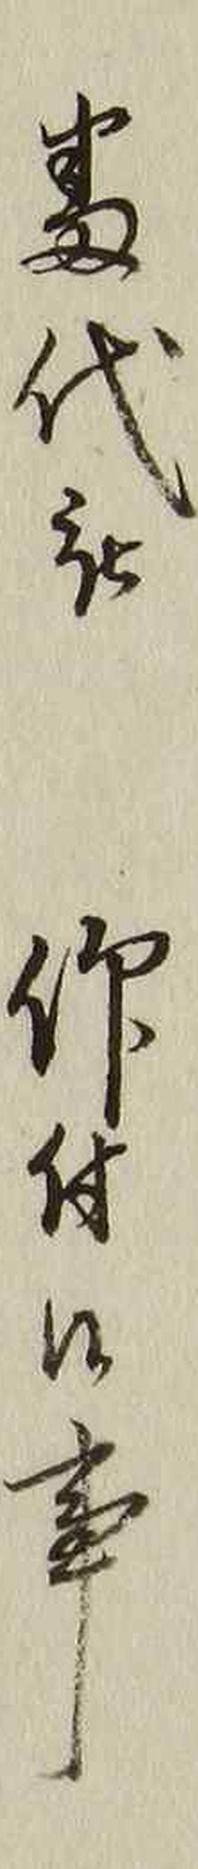番代被仰付候事
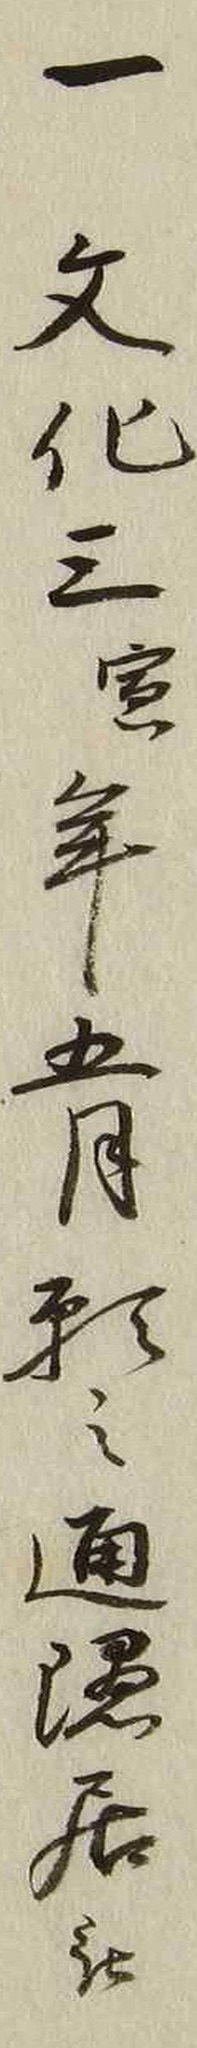一文化三寅年五月願之通隠居被
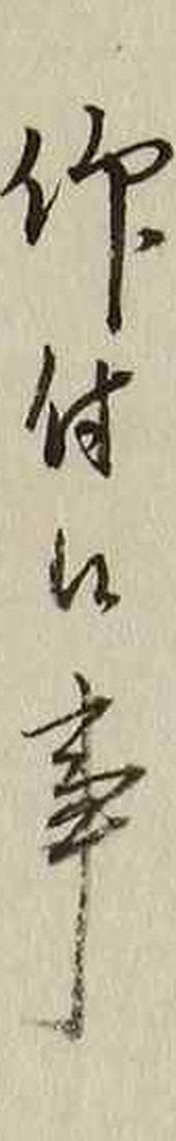仰付候事
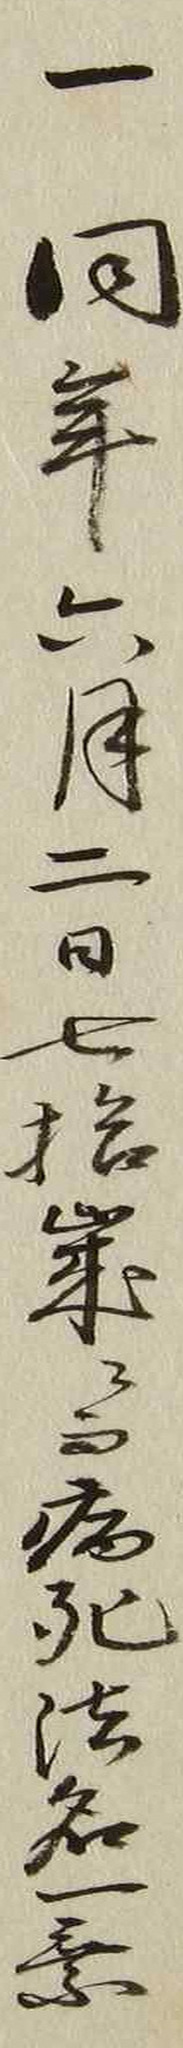一同年六月二日七拾歳ニ而病死法名一乗
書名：諸士系譜　巻之149　そ之部2
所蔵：会津若松市立会津図書館
